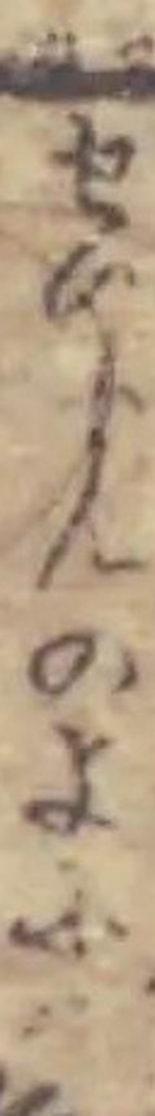せいじんのよには
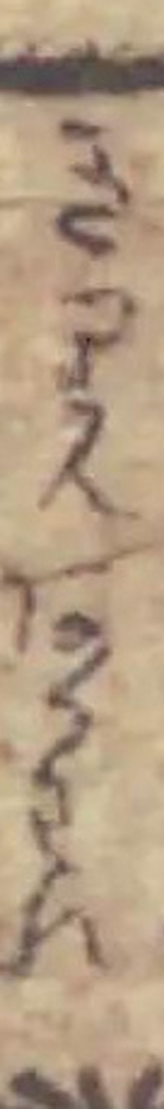きりんあらわれ
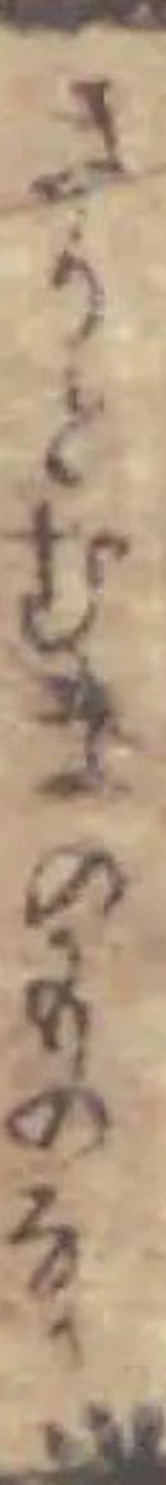きりとむまのものなり
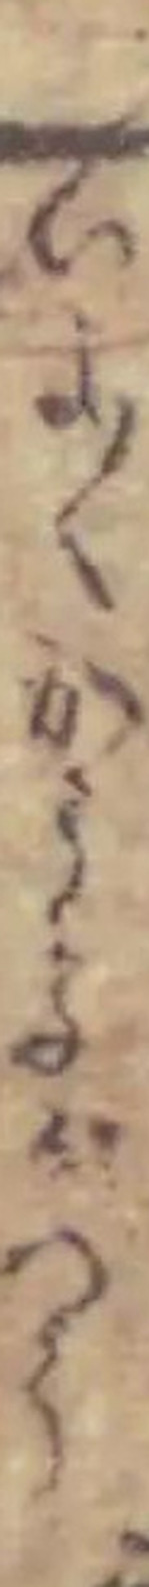いよ〳〵かう子がつう
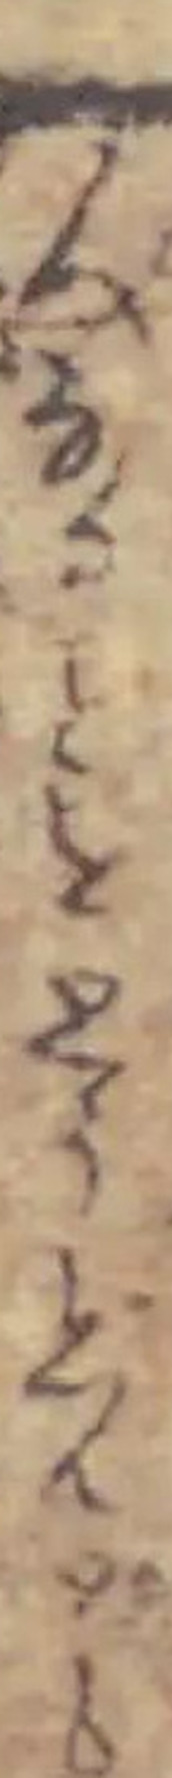人なることをとうじんども
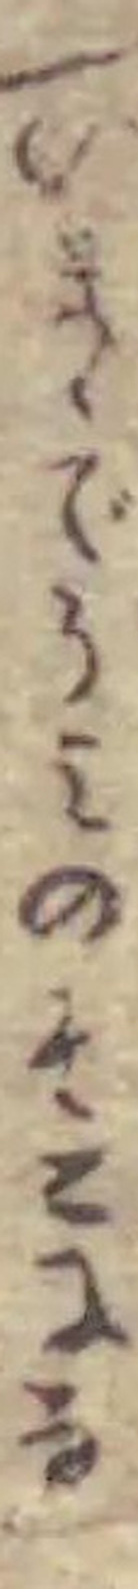いまゝでうみのそこにな
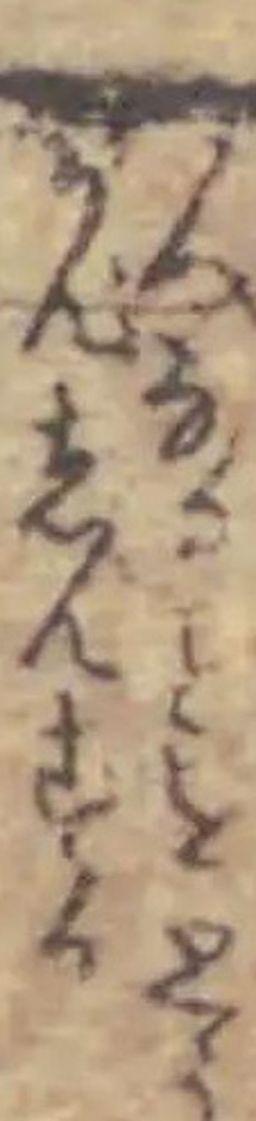かんしんする
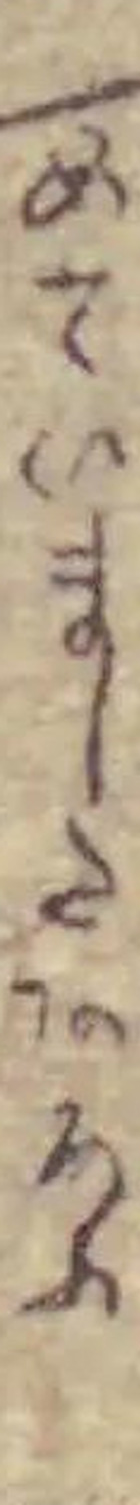めていましたあな

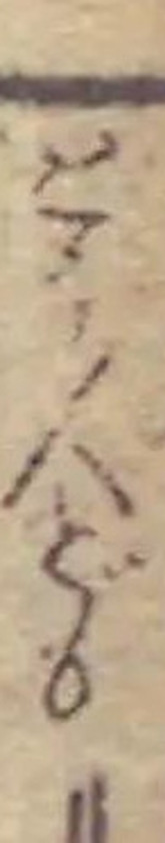とう人ども
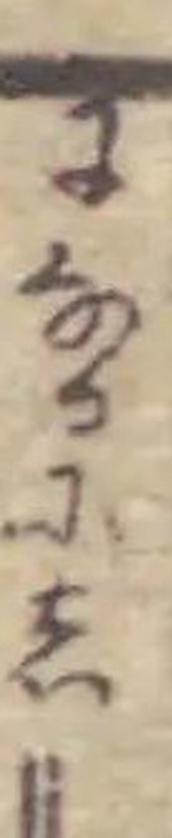になるにし
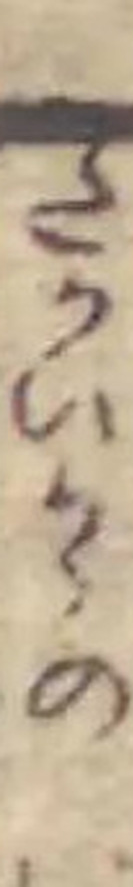たかいからの
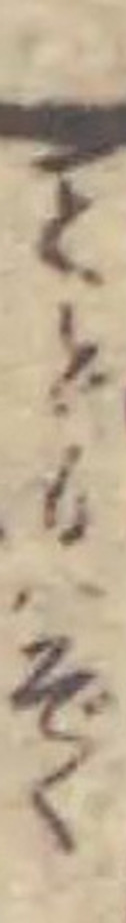ことともはぞく
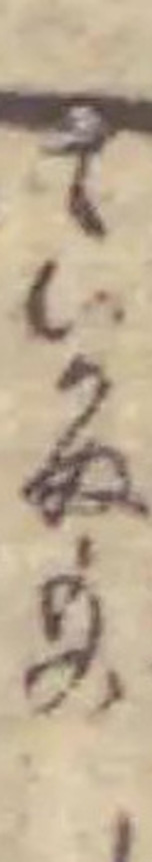ていかぬもの
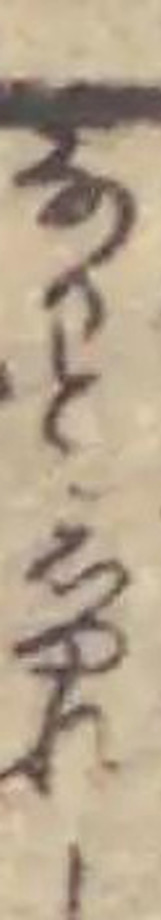なりとしやれ
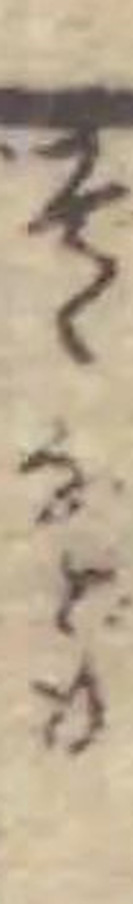そくなども
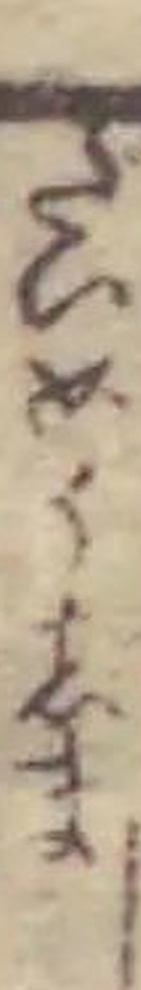だいめうしま
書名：茶羅毛通人 3巻
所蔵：国立国会図書館 National Diet Library, JAPAN
